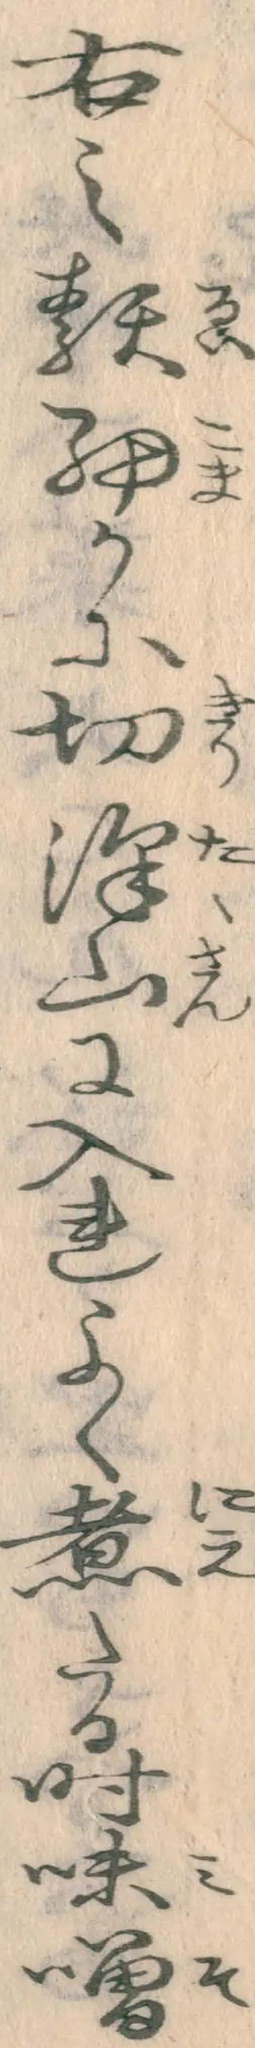右之類細かに切沢山に入れよく煮たる時味噌
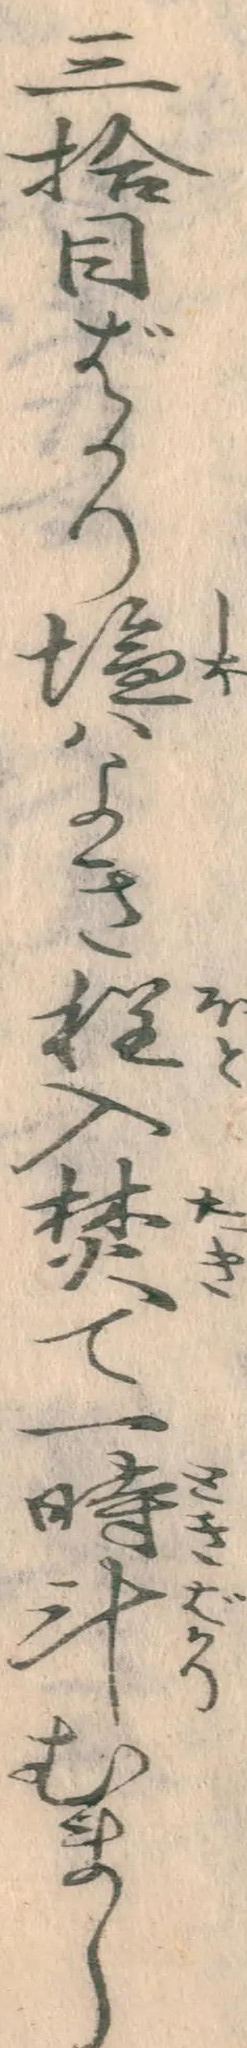三拾目ばかり塩はよき程入焚て一時計むまし
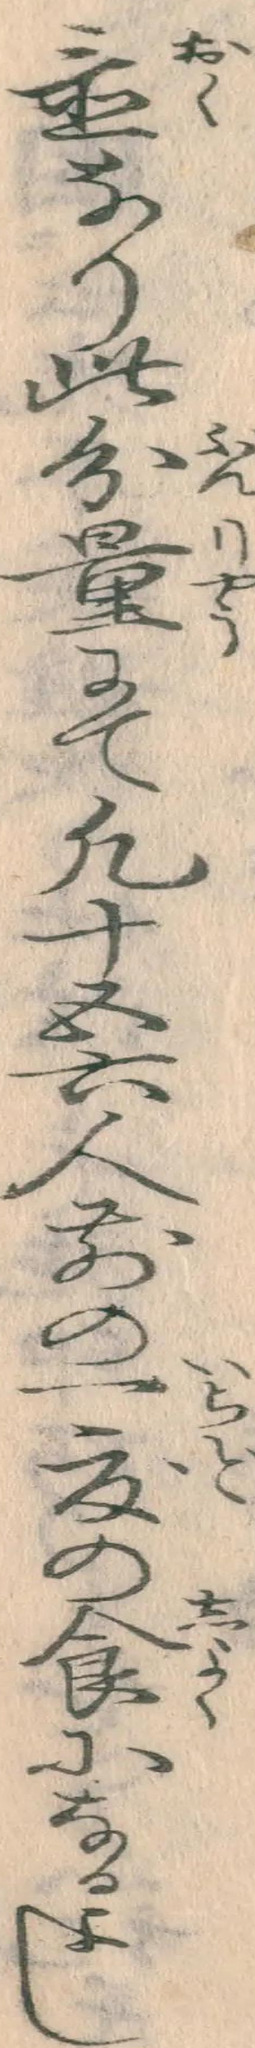置なり此分量にて凡十五六人前の一度の食になるよし
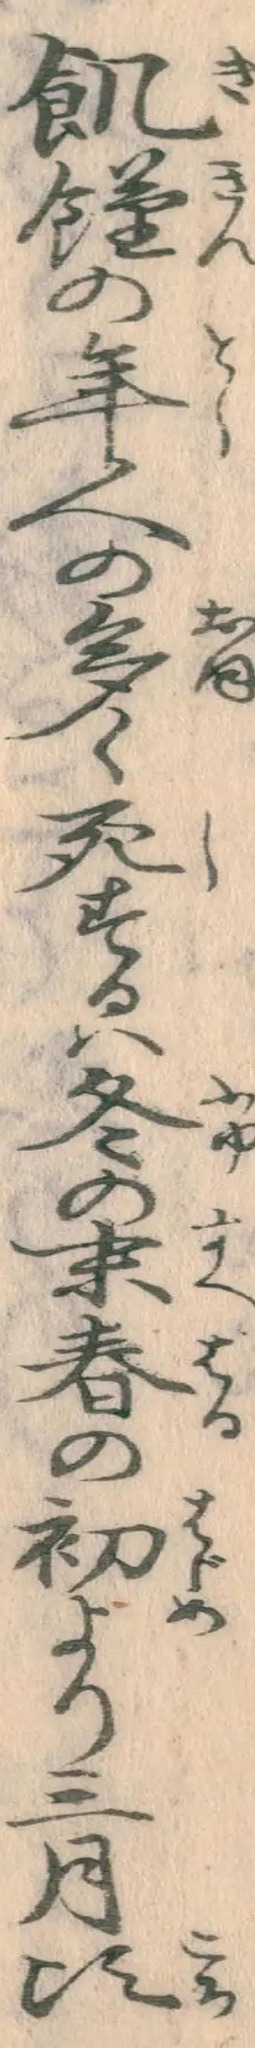飢饉の年人の多く死するは冬の末春の初より三月頃
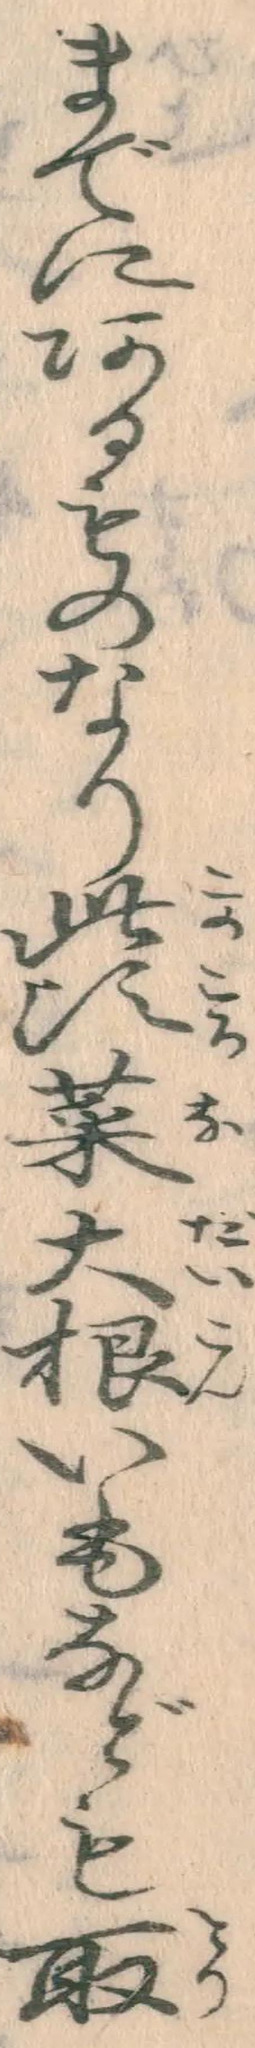までにあるものなり此頃菜大根いもなども取
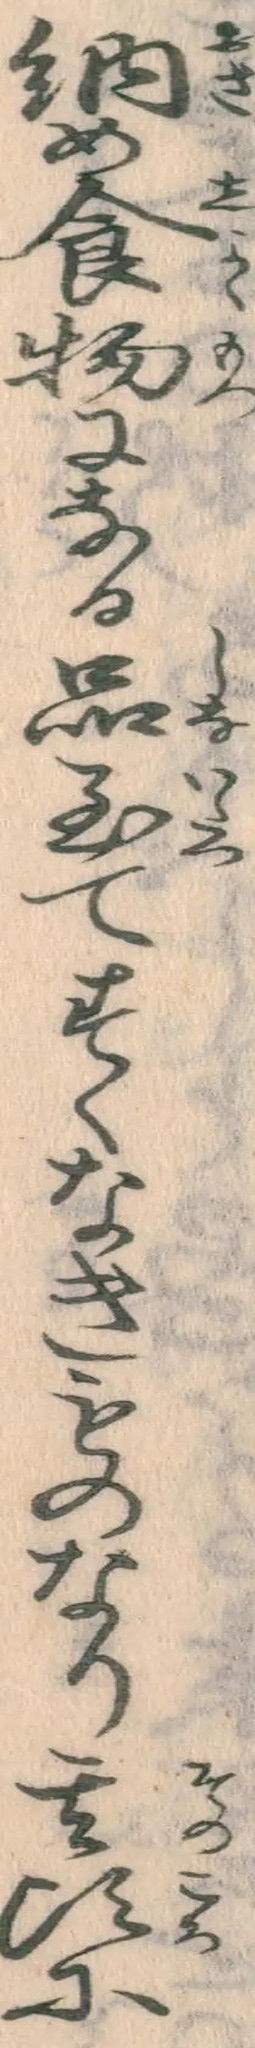納め食物になる品至てすくなきものなり其頃に
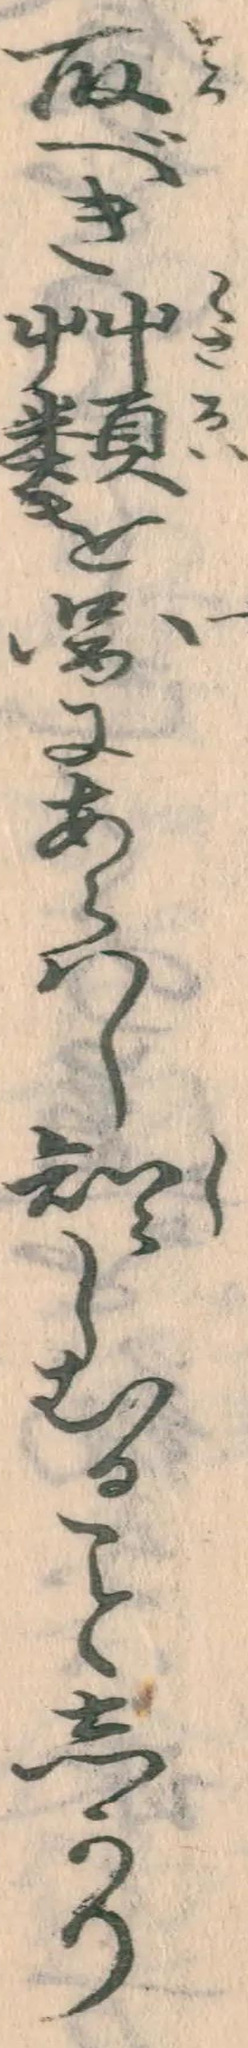取べき艸類を図にあらはし知らしむることしかり
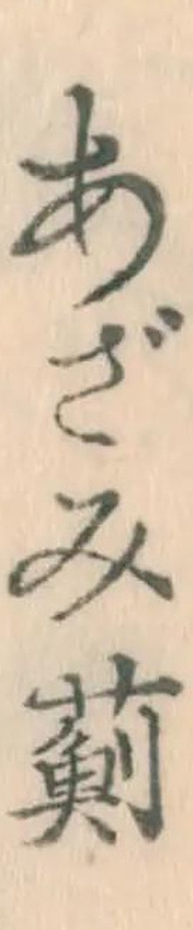あざみ薊
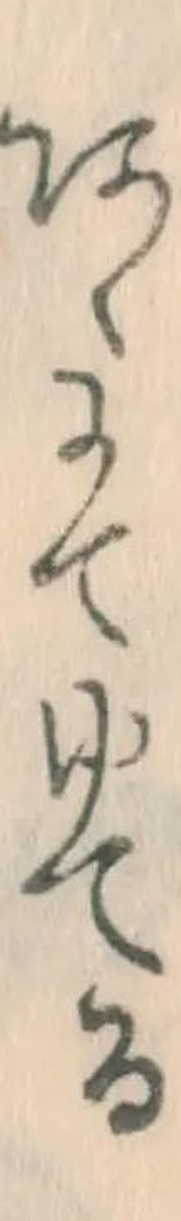あくにてゆてる
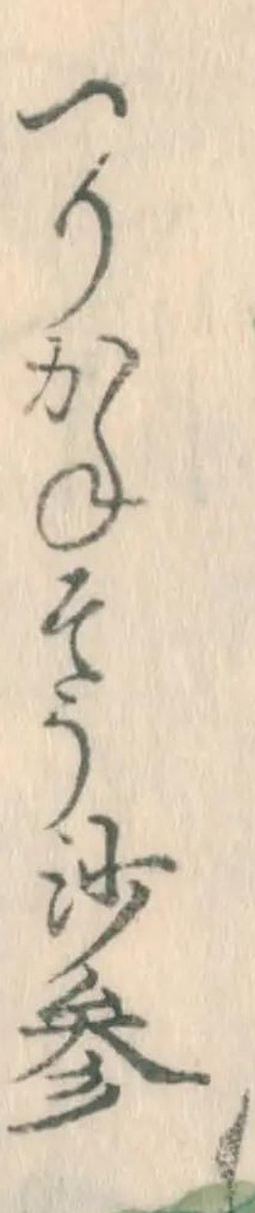つりかねそう沙参

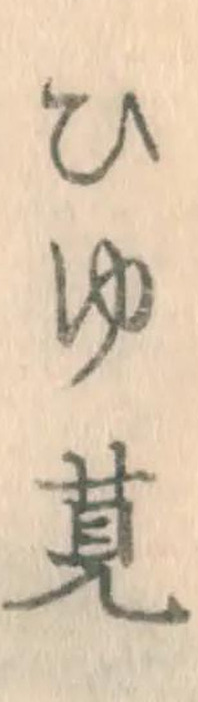ひゆ莧
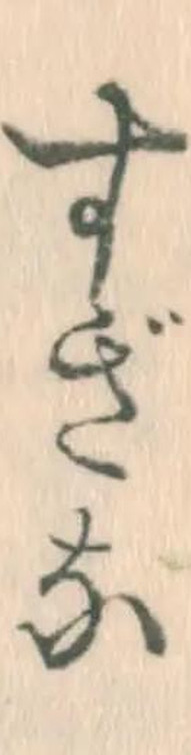すぎな
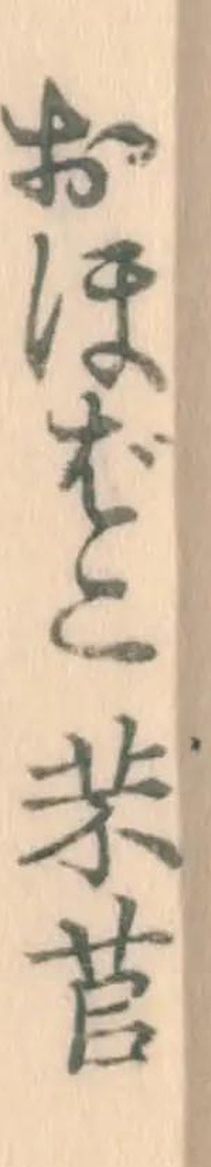おほばこ芣苢
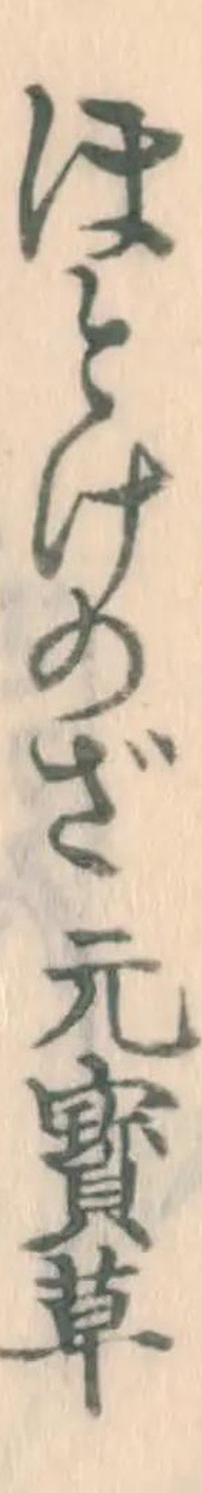ほとけのざ元寳草

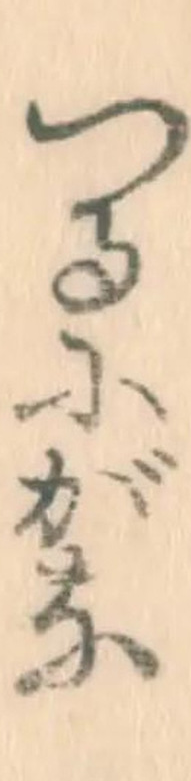つるにがな
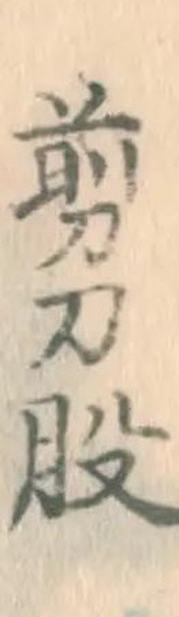剪刀股
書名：救荒野菜圖説
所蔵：国立国会図書館 National Diet Library, JAPAN
